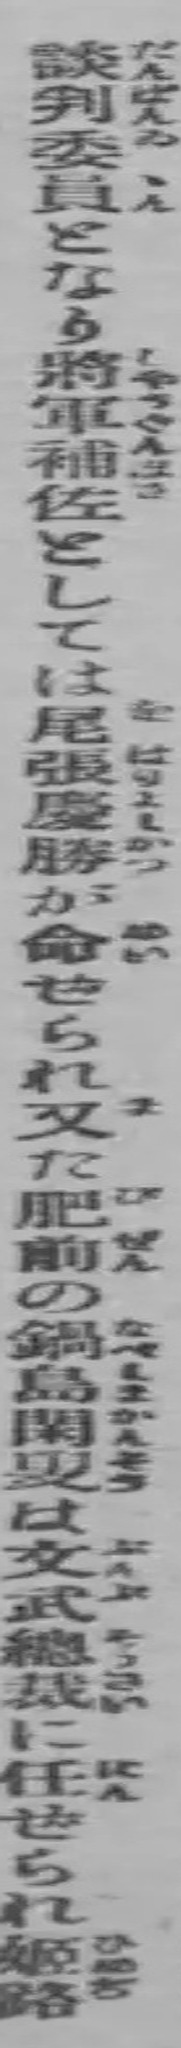談判委員となり将軍補佐としては尾張慶勝が命ぜられ又た肥前の鍋島閑叟は文武総裁に任ぜられ姫路
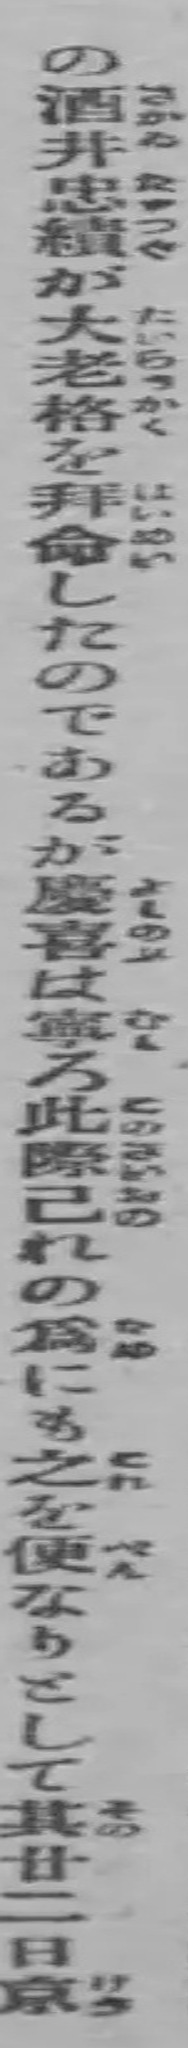の酒井忠績が大老格を拝命したのであるが慶喜は寧ろ此際己れの為にも之は便なりとして其廿二日京
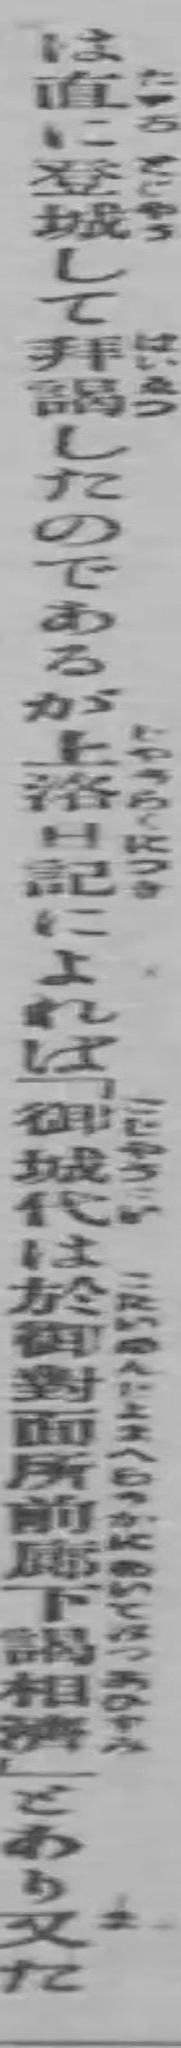は直に登城して拝謁したのであるが上洛日記によれば「御城代は於御対面所前廊下謁相済」とあり又た
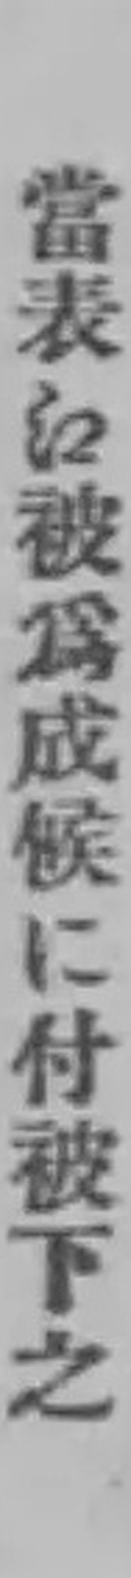当表江被為成候に付被下之
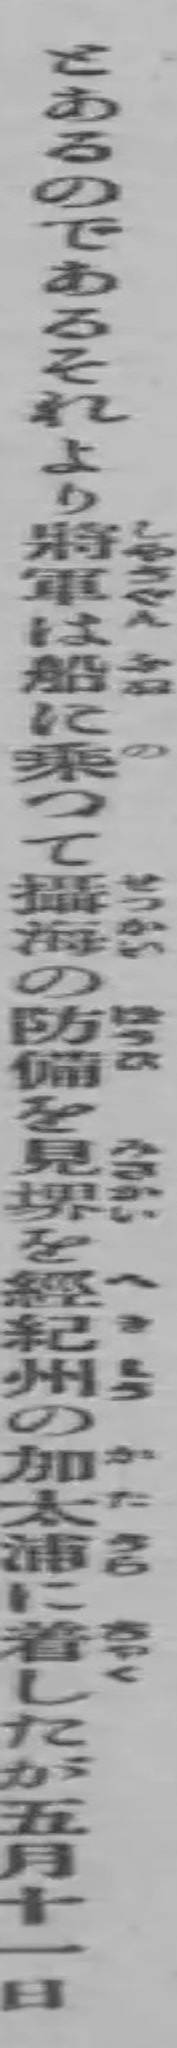とあるのであるそれより将軍は船に乗つて摂海の防備を見堺を経紀州の加太浦に着したが五月十一日
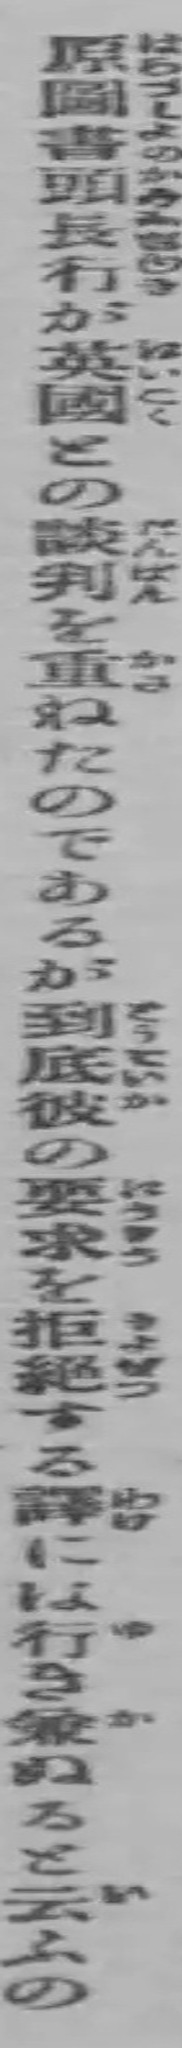原図書頭長行が英国との談判を重ねたのであるが到底彼の要求を拒絶する訳には行き兼ぬると云ふの
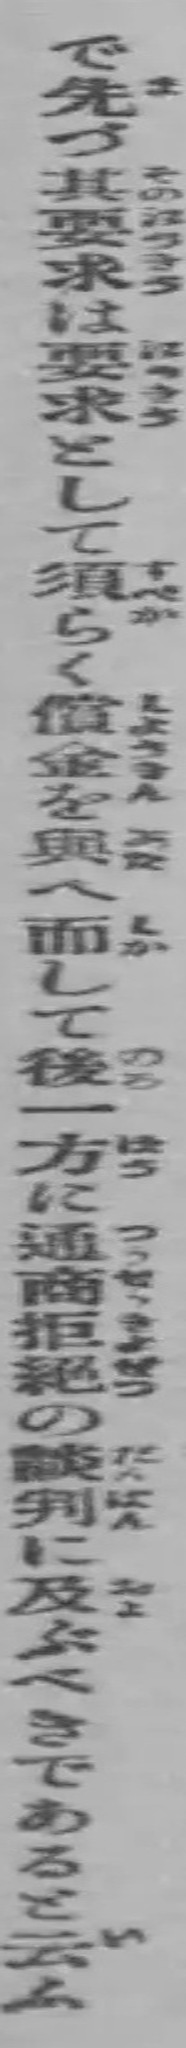で先づ其要求は要求として須らく賞金を与へ而して後一方に通商拒絶の談判に及ぶべきであると云ふ

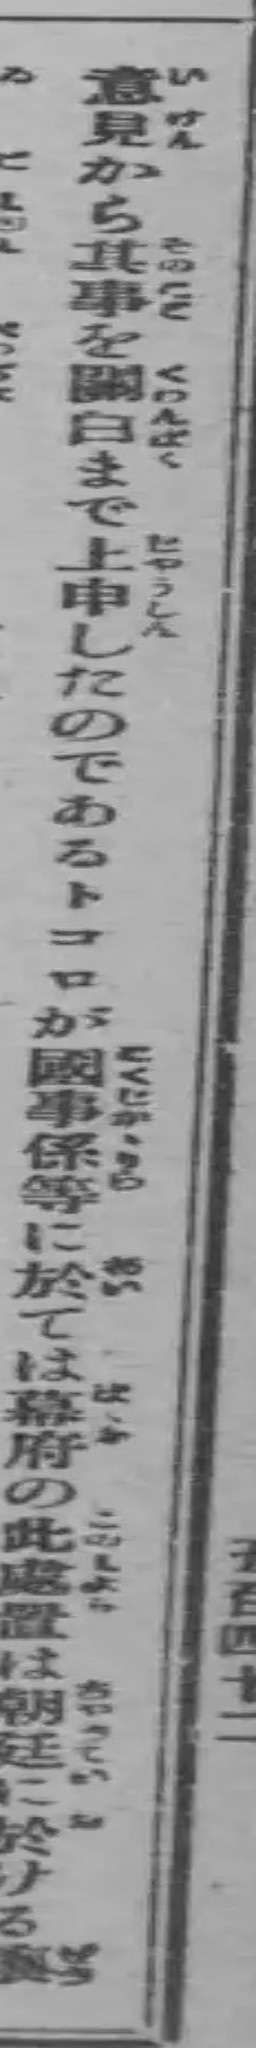意見から其事を関白まで上申したのであるトコロが国事係等に於ては幕府の此処置は朝廷に於ける攘
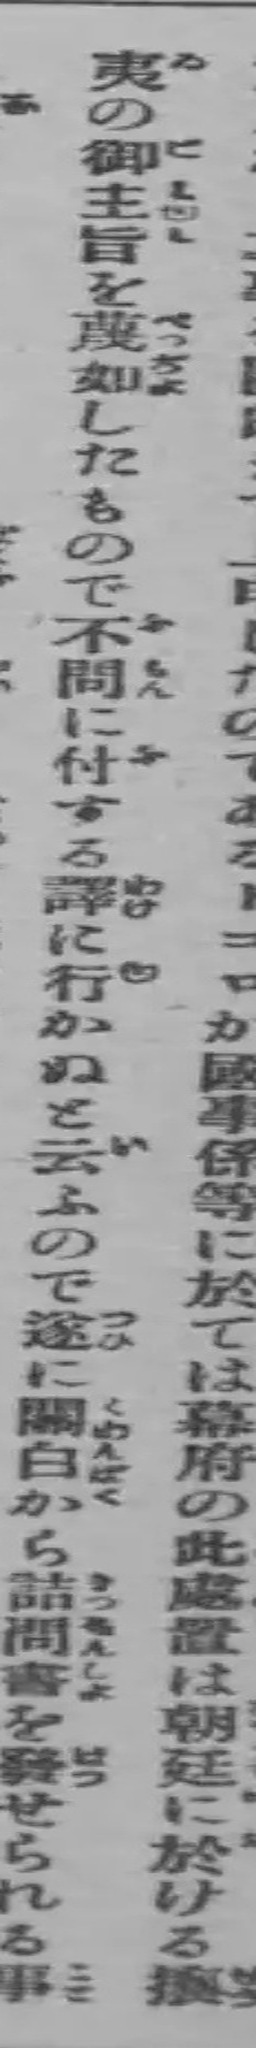夷の御主旨を蔑如したもので不問に付する訳に行かぬと云ふので遂に関白から詰問書を発せられる事
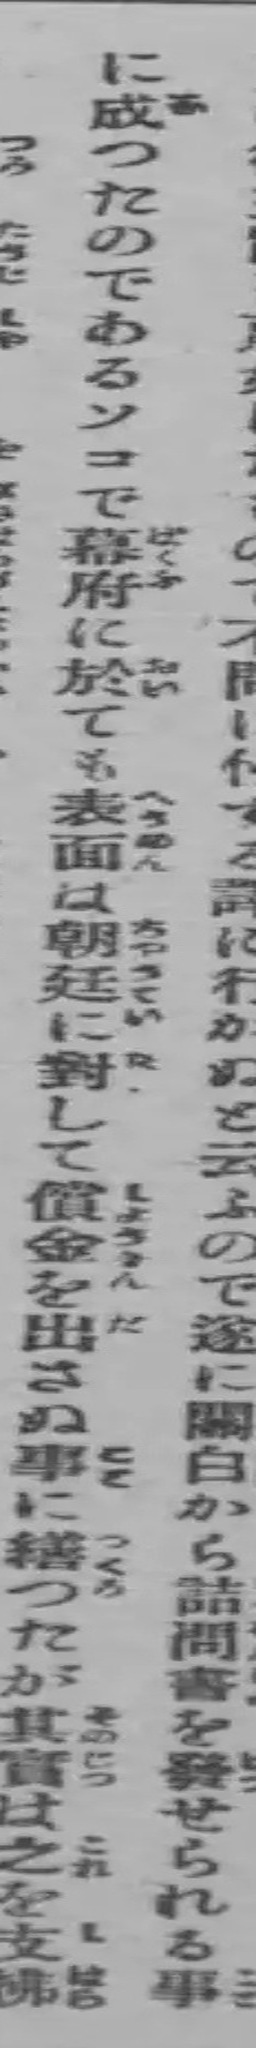に成つたのであるソコで幕府に於ても表面は朝廷に対して償金を出さぬ事に繕つたが其実は之を支払
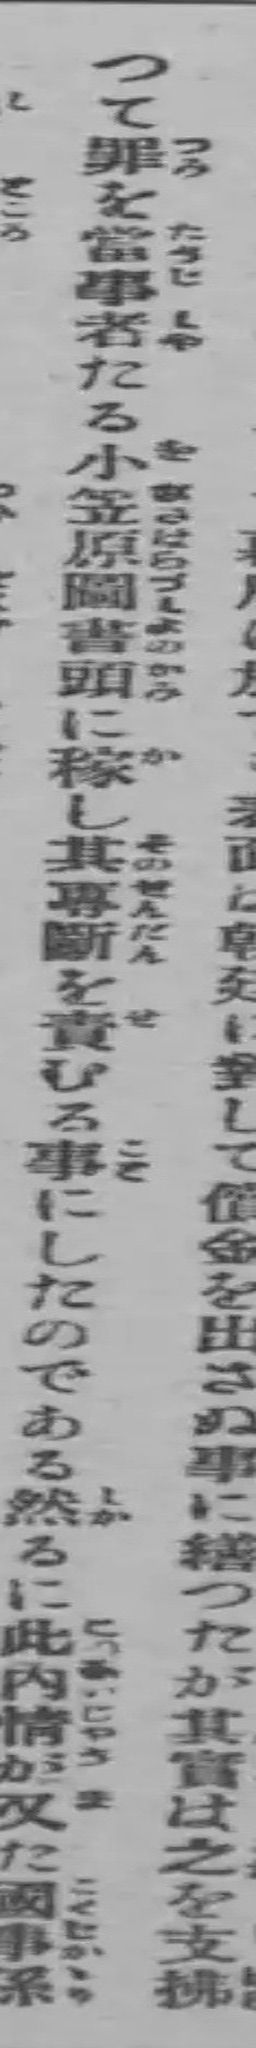つて罪を当事者たる小笠原図書頭に稼し其専断を責むる事にしたのである然るに此内情が又た国事係
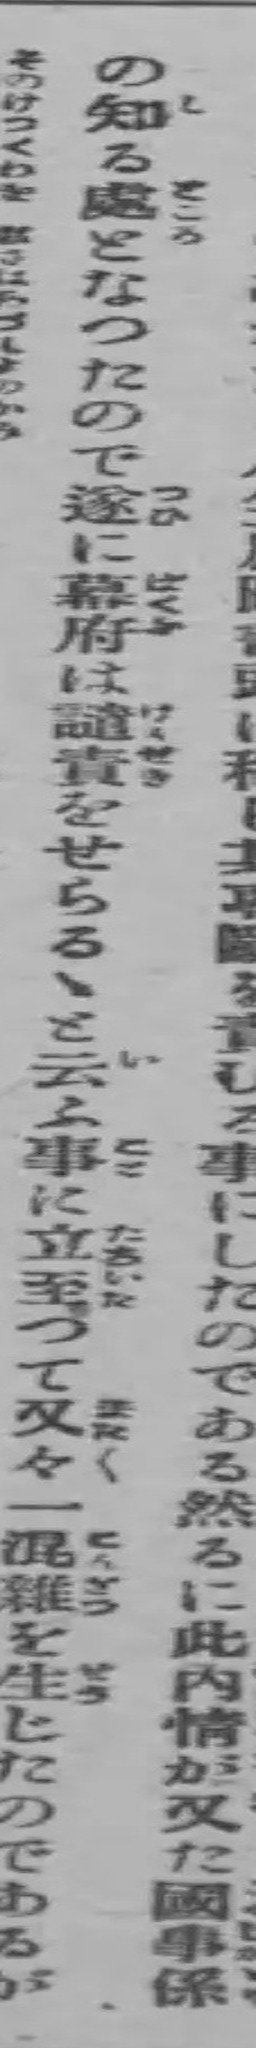の知る処となつたので遂に幕府は譴責せらるゝと云ふ事に立至つて又々一混雑を生じたのであるが
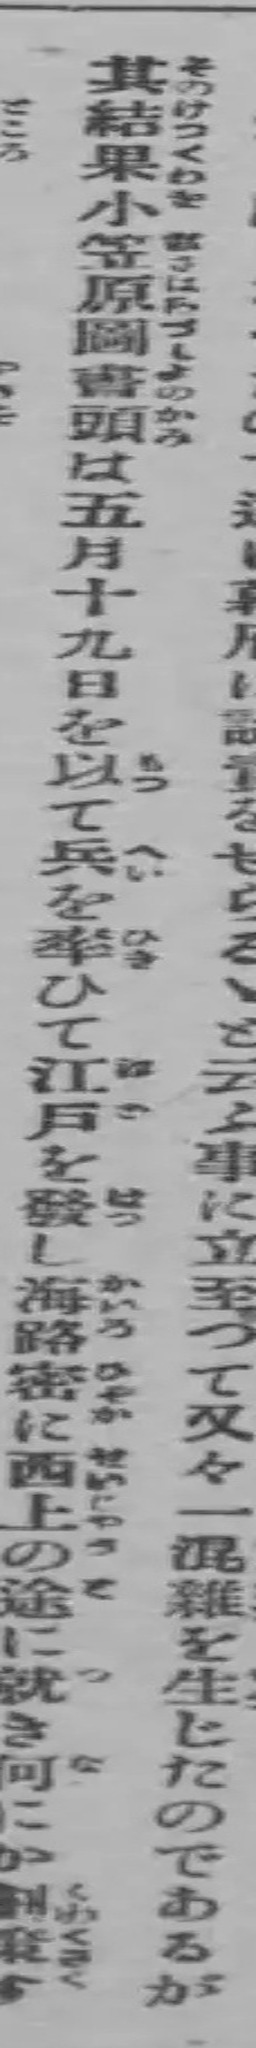其結果小笠原図書頭は五月十九日を以て兵を率ひて江戸を発し海路密に西上の途に就き何にか画策す
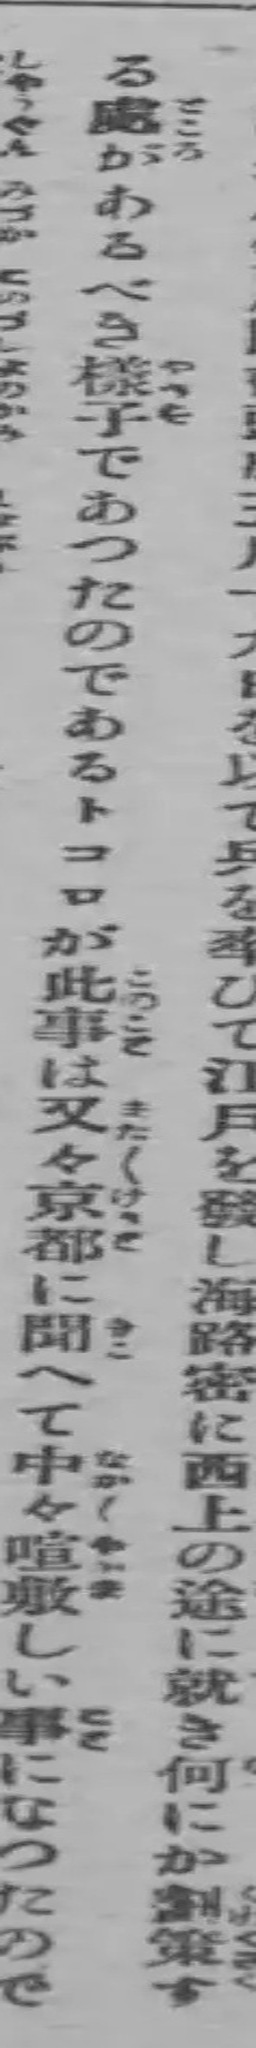る処があるべき様子であつたのであるトコロが此事は又々京都に聞へて中々喧敷しい事になつたので
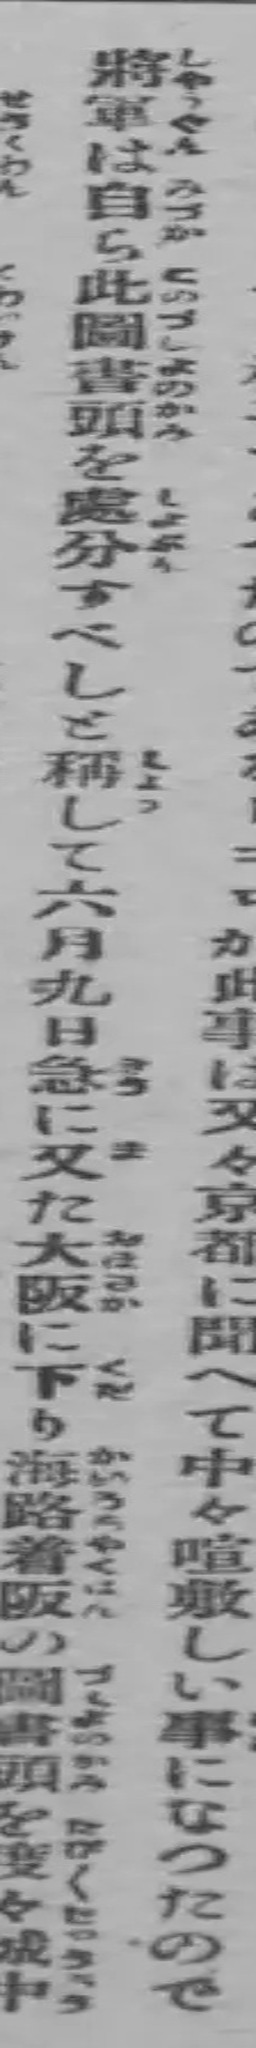将軍は自ら此図書頭を処分すべしと称して六月九日急に又た大阪に下り海路着阪の図書頭を度々城中
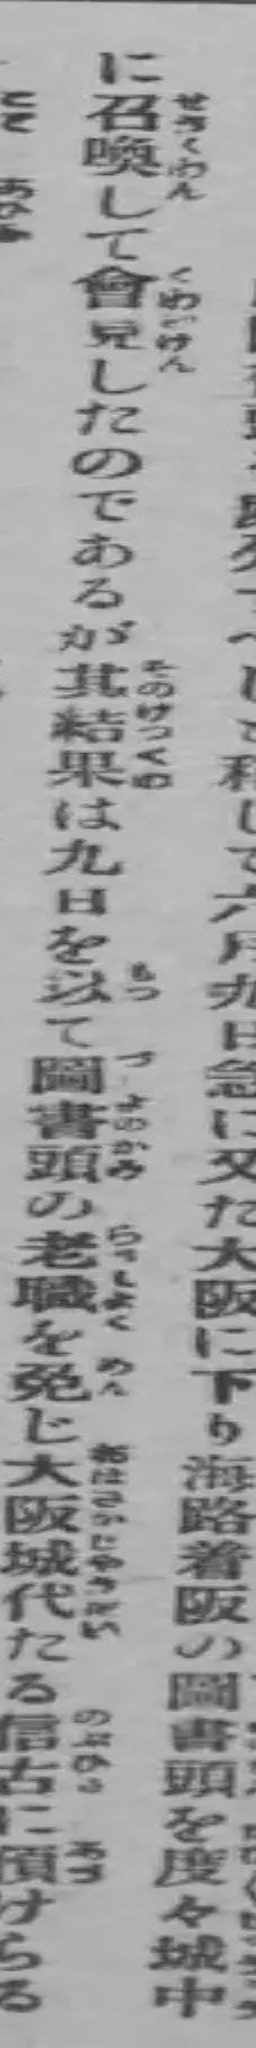に召喚して会見したのであるが其結果は九日を以て図書頭の老職を免じ大阪城代たる信古に預けらる
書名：豊橋市史談
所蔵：国立国会図書館 National Diet Library, JAPAN
